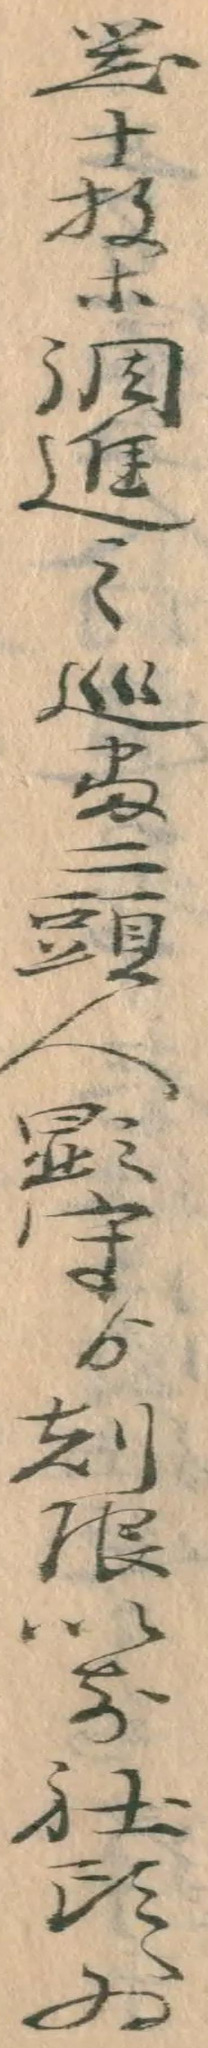器十枚等調進之巡番二頭人顕守ゟ刻限以前社頭へ為
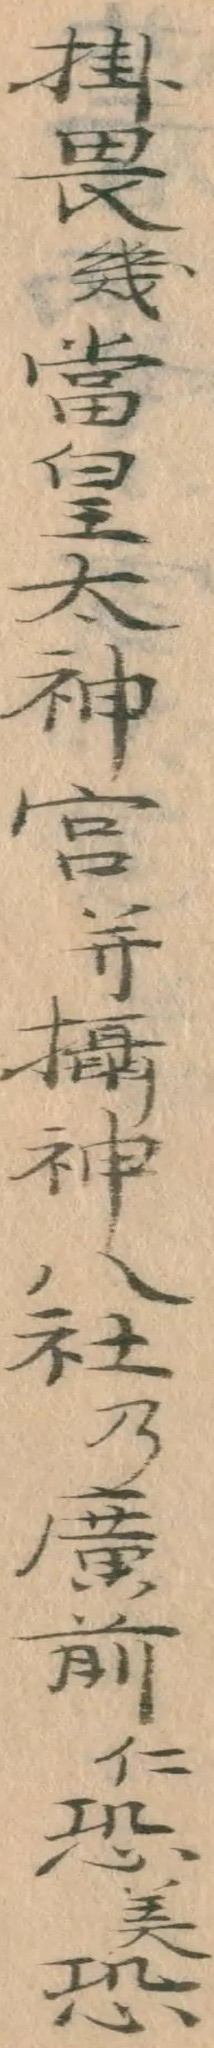掛畏幾當皇太神宮并摂神八社乃廣前仁恐美恐
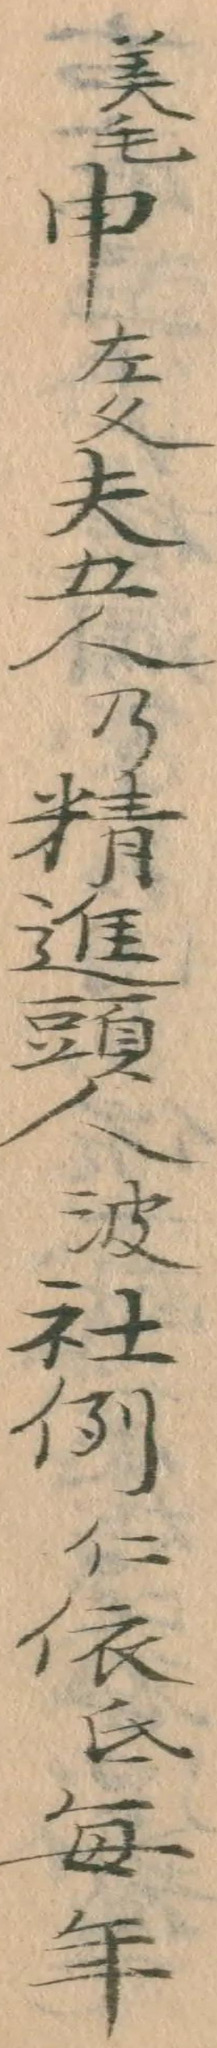美毛申左久夫五人乃精進頭人波社例仁依氐毎年
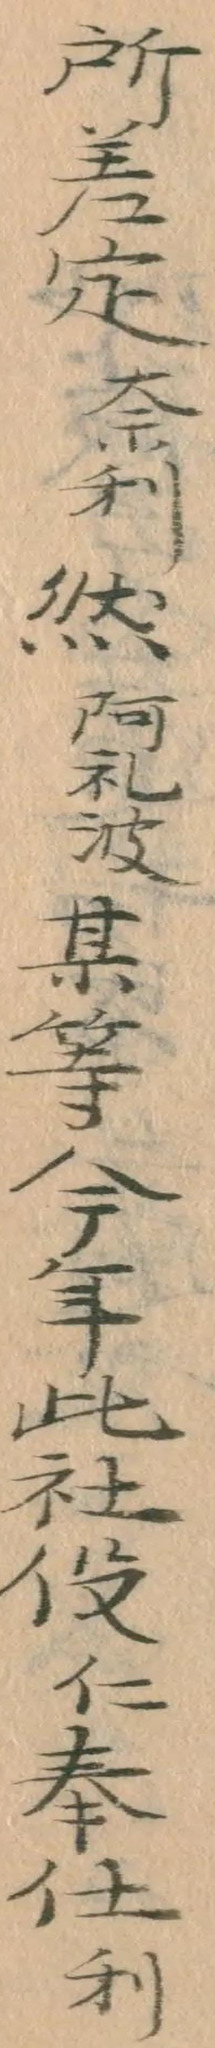所差定奈利然阿礼波某等今年此社役仁奉仕利
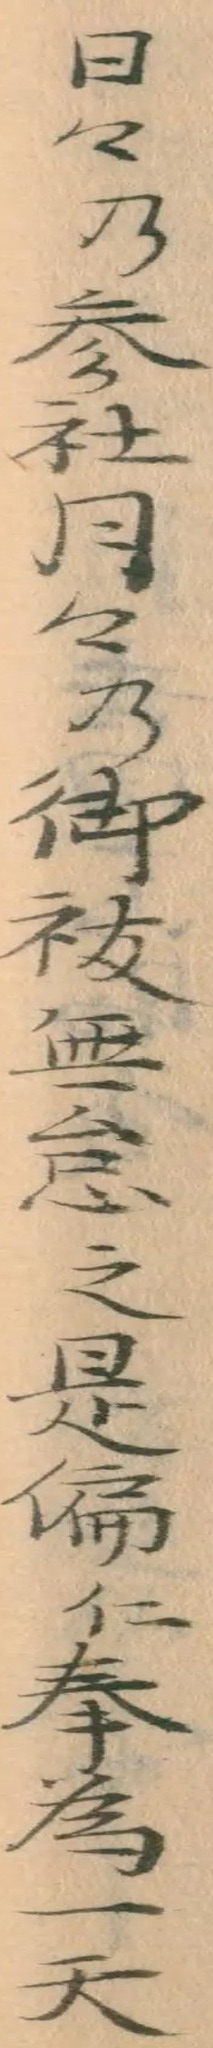日々乃参社月々乃御祓無怠之是偏仁奉為一天
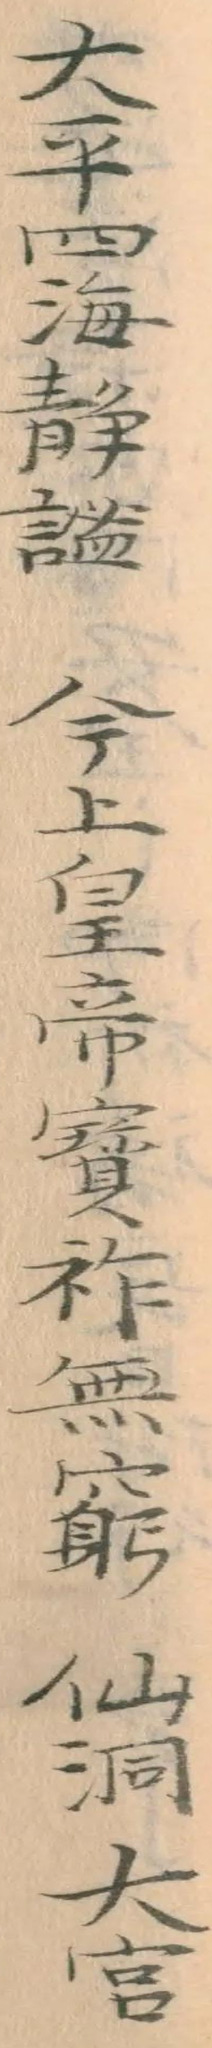大平四海静謐今上皇帝宝祚無窮仙洞大宮
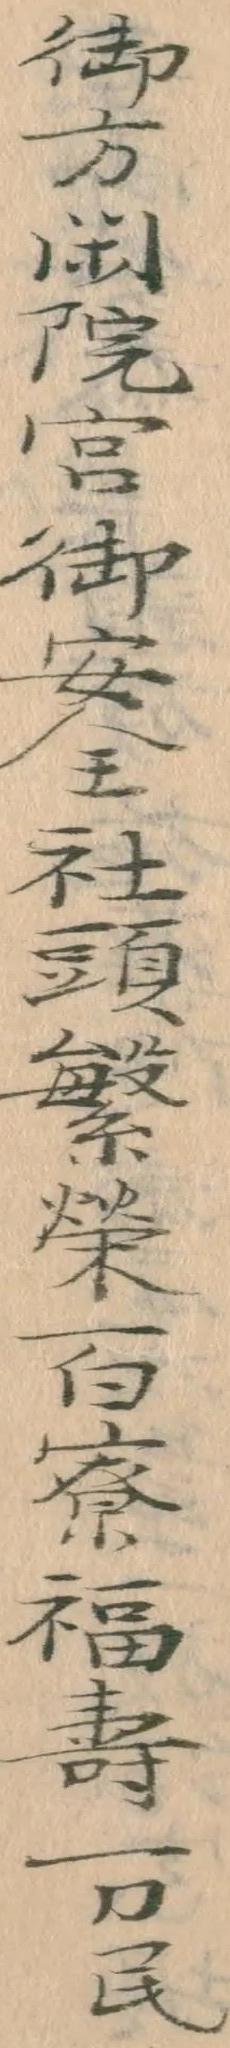御方閑院宮御安全社頭繁榮百寮福壽万民
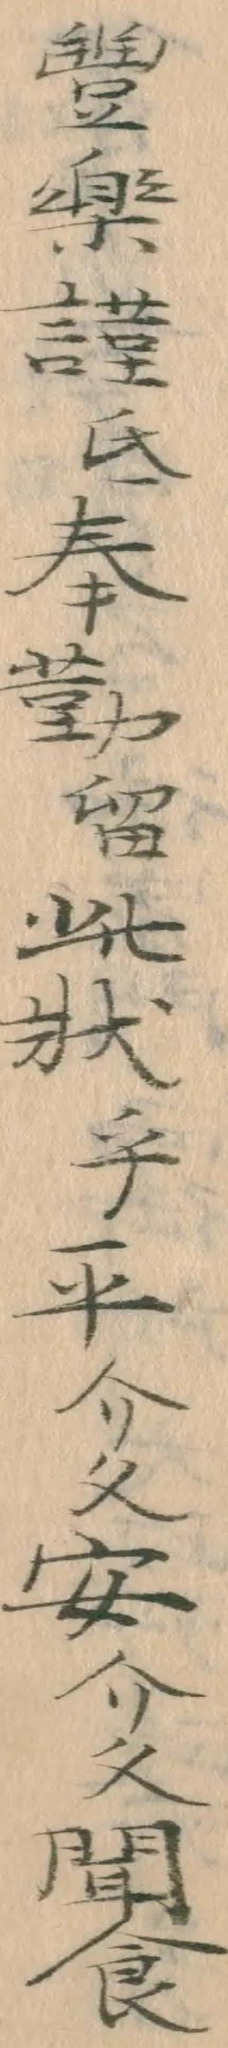豊楽謹氐奉勤留此状乎平介久安介久聞食
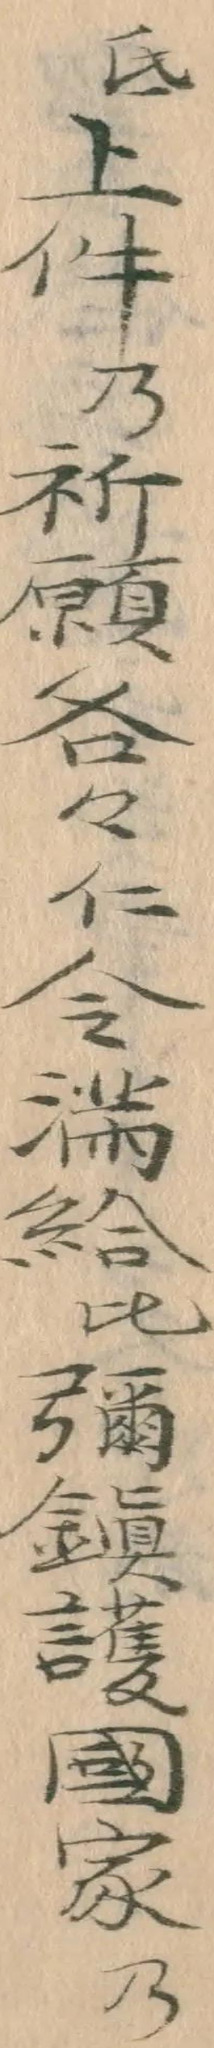氐上件乃祈願各々仁令満給比弥鎮護國家乃
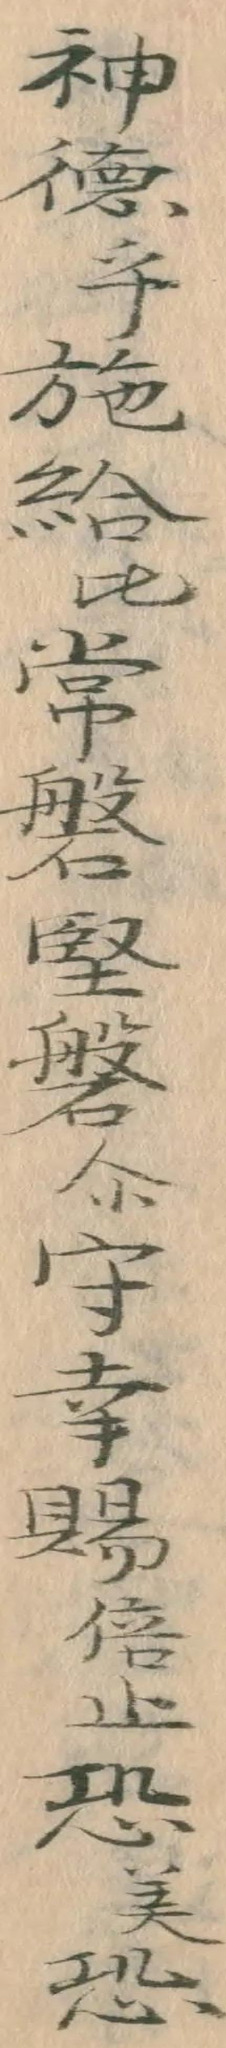神徳乎施給比常磐堅磐尒守幸賜倍止恐美恐
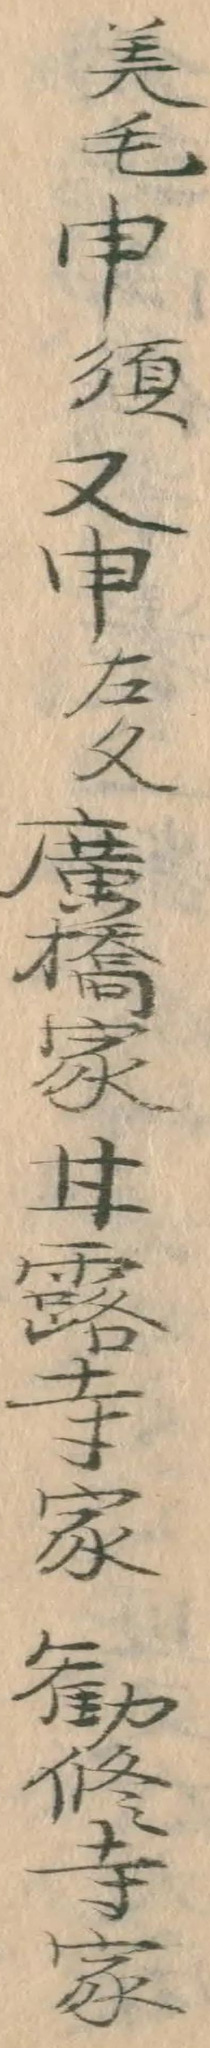美毛申須又申左久廣橋家甘露寺家勧修寺家
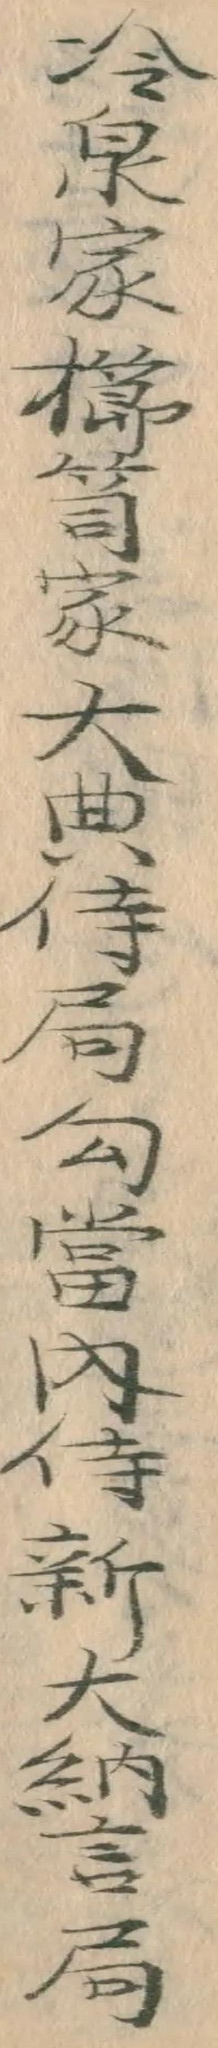冷泉家櫛笥家大典侍局勾當内侍新大納言局
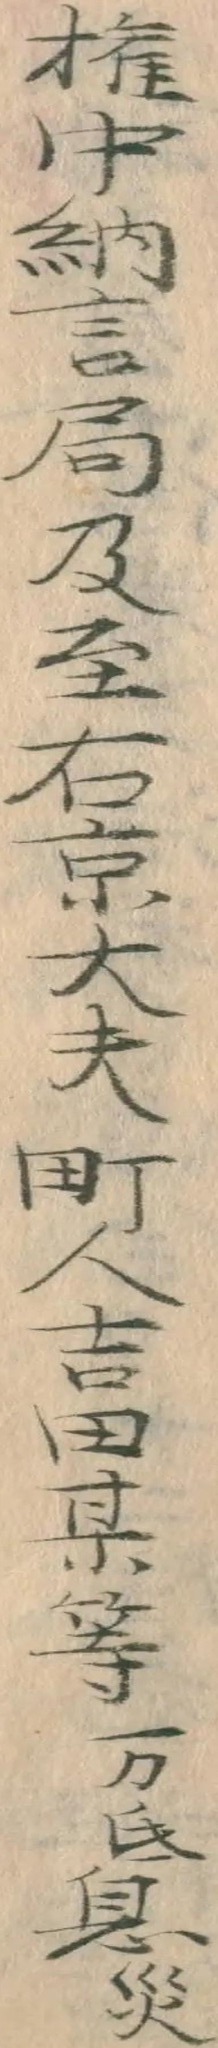権中納言局及至右京大夫町人吉田某等万氐息災
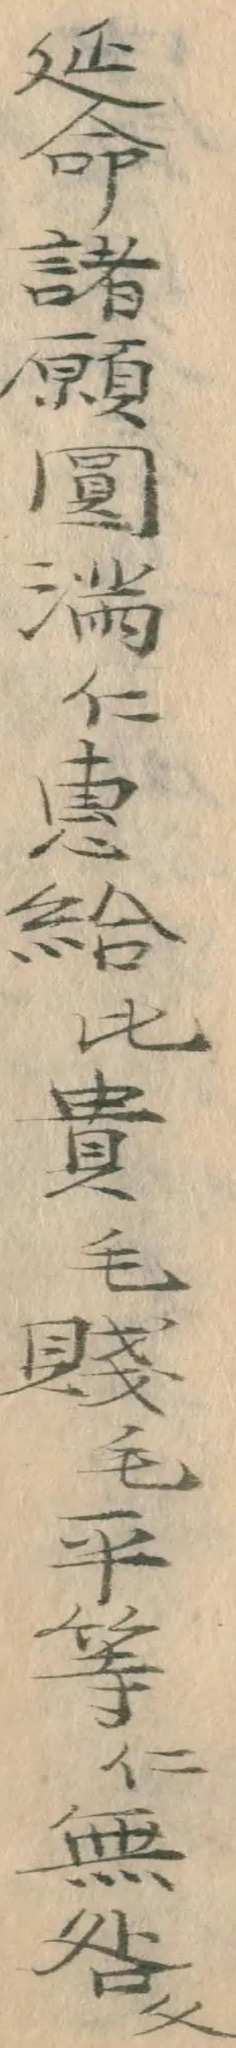延命諸願圓満仁恵給比貴毛賤毛平等仁無咎久
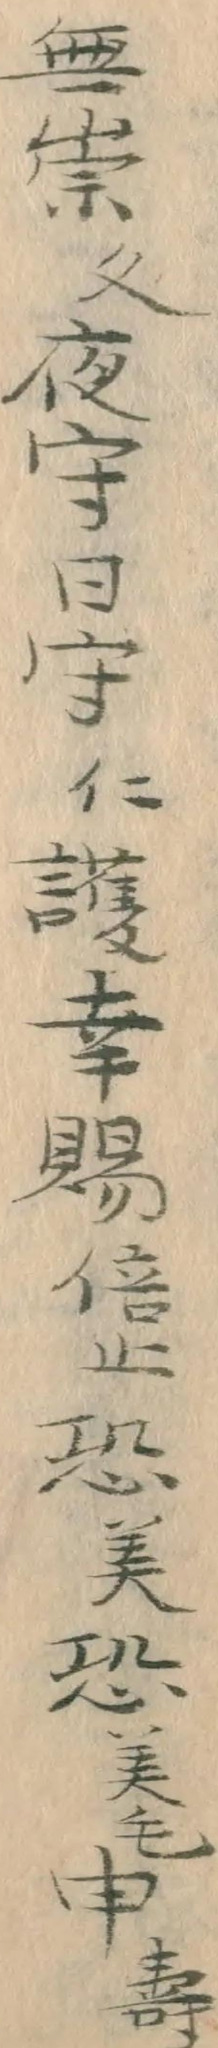無崇久夜守日守仁護幸賜倍止恐美恐美毛申壽

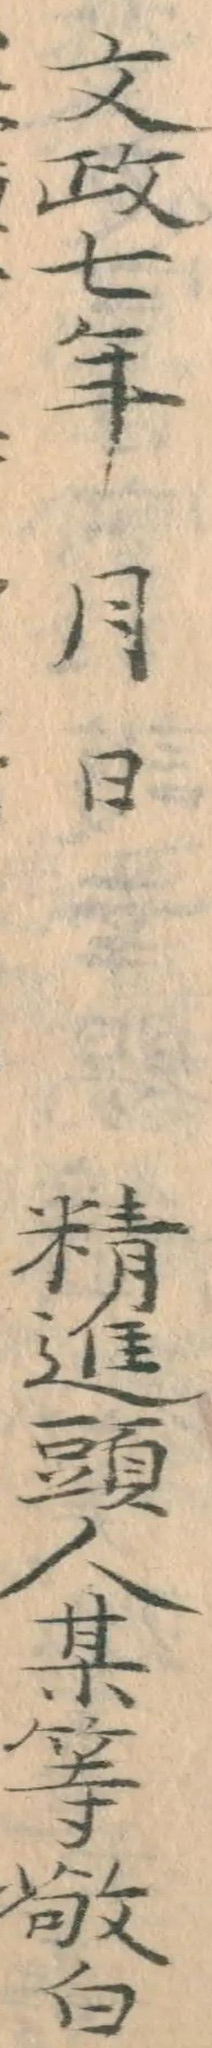文政七年月日精進頭人某等敬白
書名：賀茂社記録. 第72冊
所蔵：国立国会図書館 National Diet Library, JAPAN
